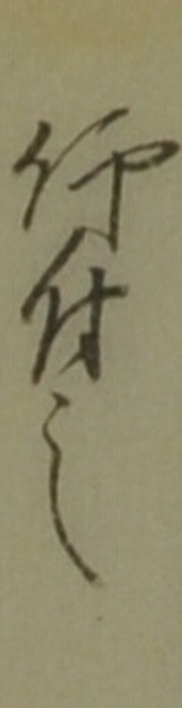仰付之
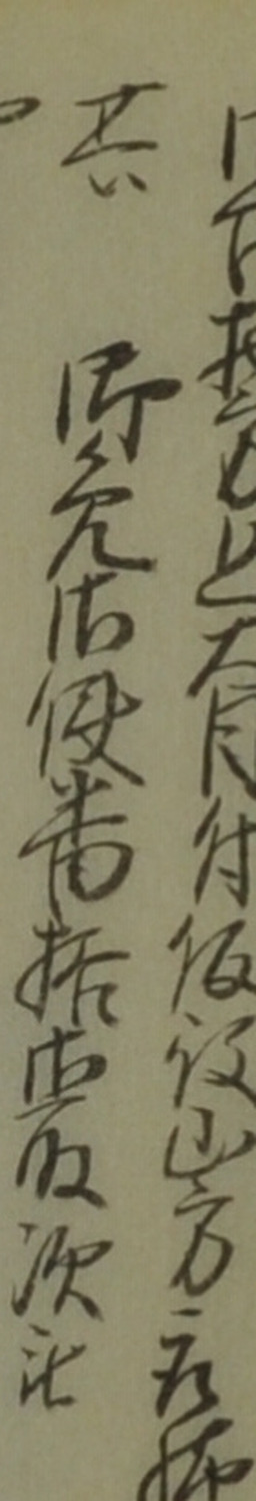共御免御使番格御取次被
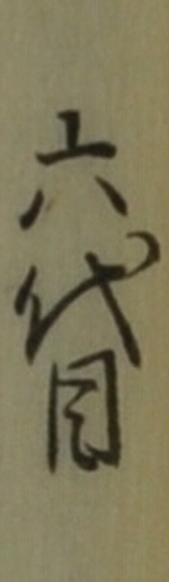六代目
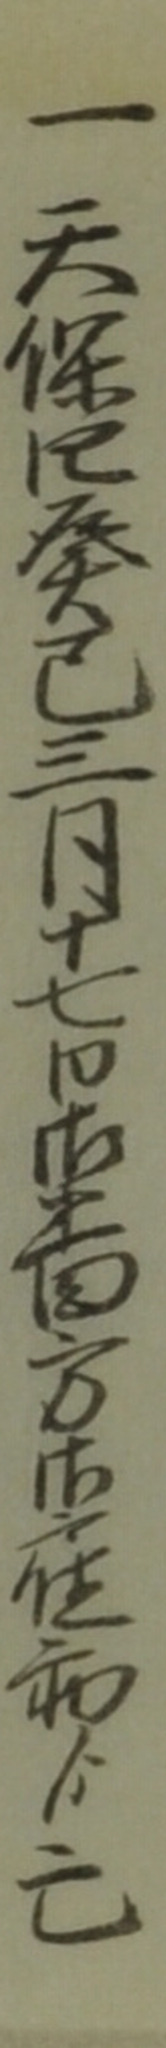一天保四癸巳三月十七日御番方御雇勤ゟ亡
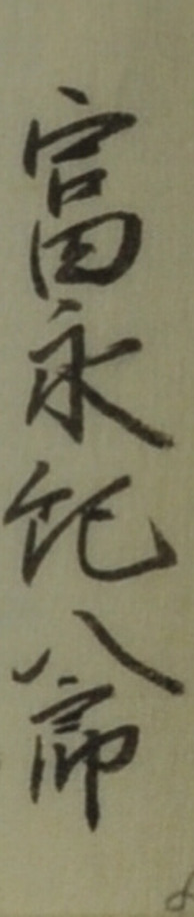富永紀八郎
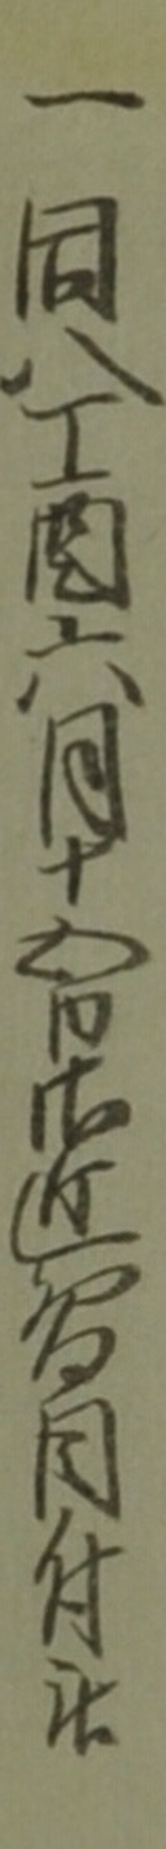一同八丁酉六月十五日御近習目付被
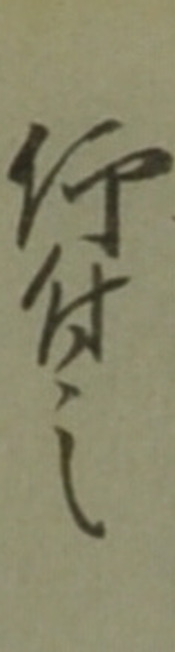仰付之
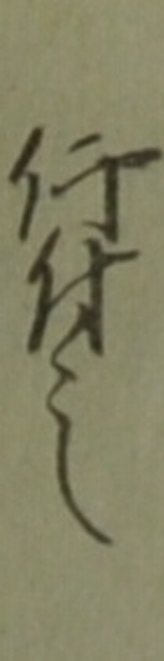仰付之
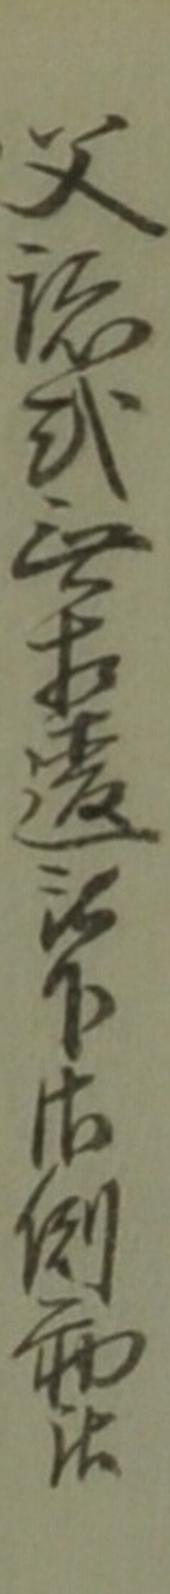父跡式無相違被成被下御側勤被
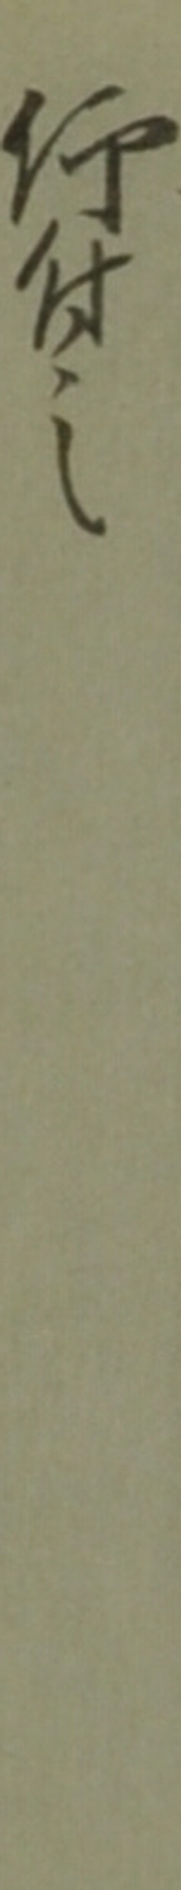仰付之
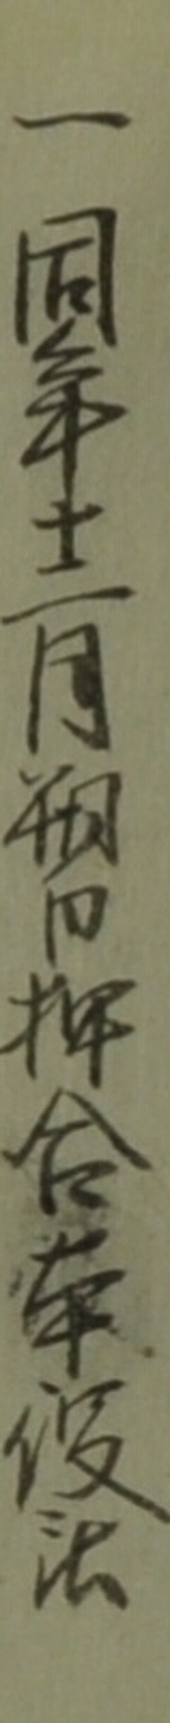一同年十二月朔日押合本役被
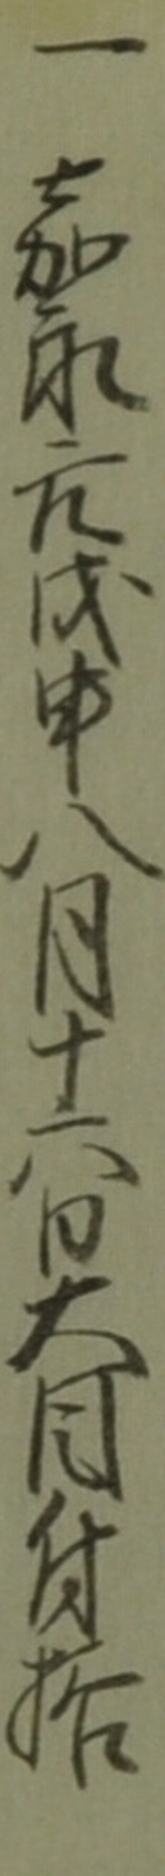一嘉永元戊申八月十六日大目付格
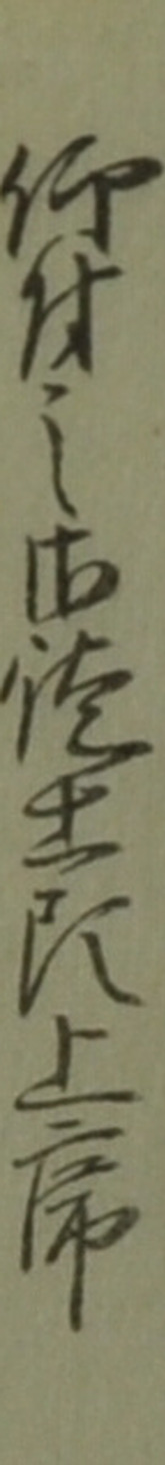仰付之御徒士頭上席
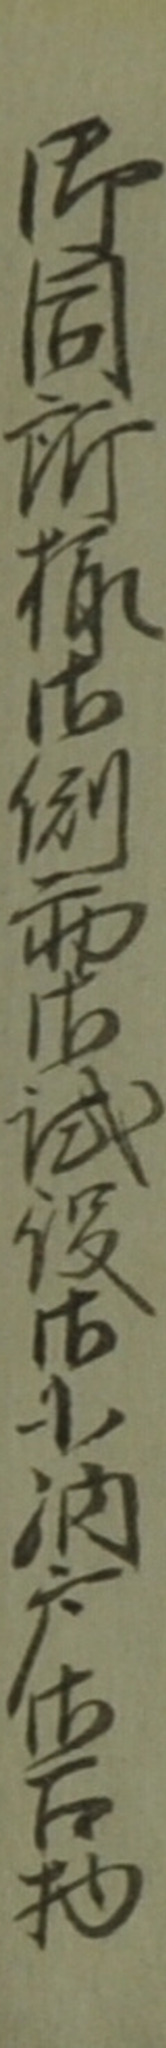御同所様御側勤御試役御小納戸御召物
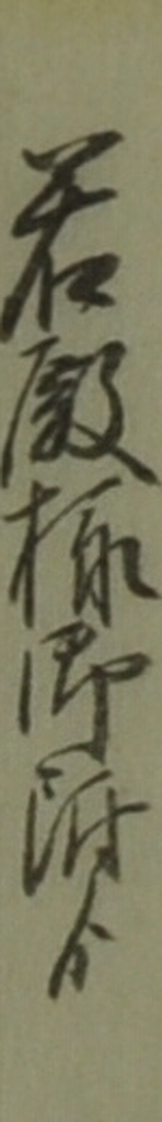若殿様御附ゟ
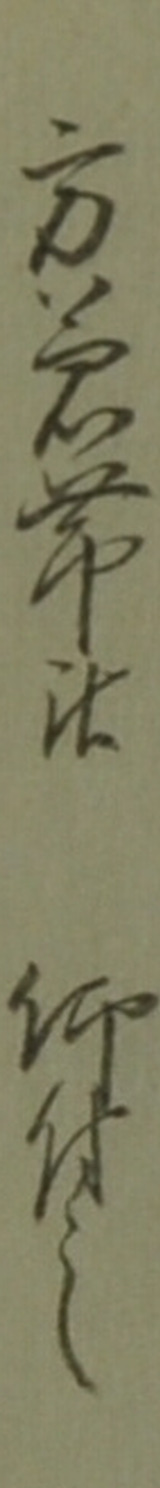方兼帯被仰付之
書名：諸御役代々録（五）
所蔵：伊那市立高遠町図書館・合同会社AMANE
